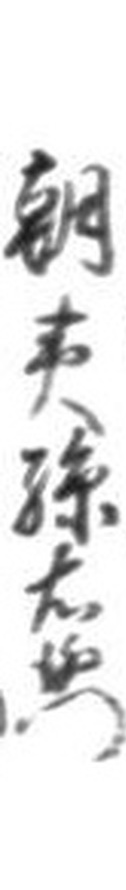朝夷孫右衛門
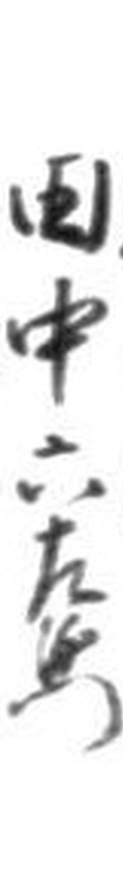田中六左衛門
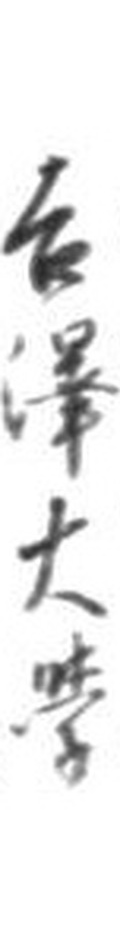吉沢大学
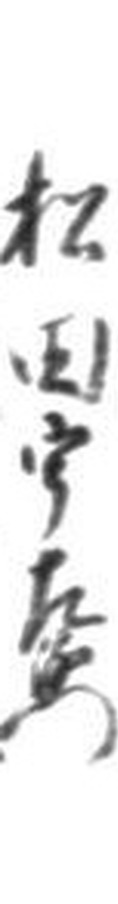松田宇左衛門
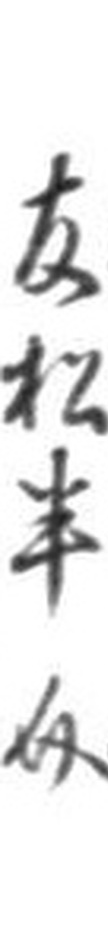友松半介
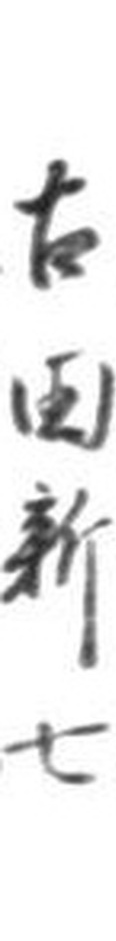古田新七
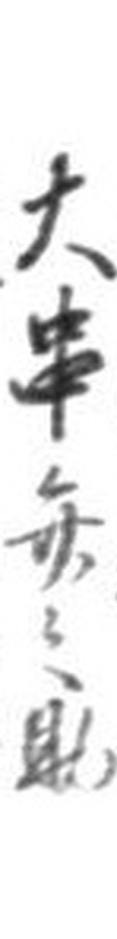大串弁之助
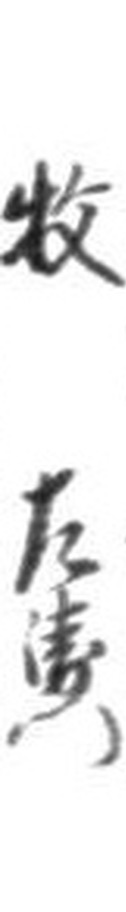牧左衛門
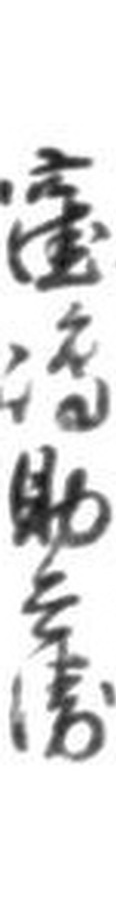窪嶋助兵衛
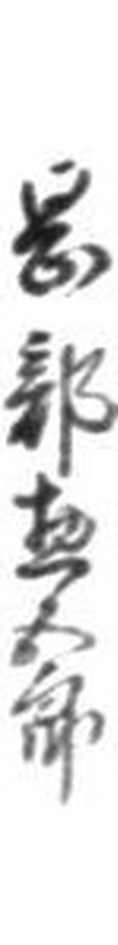岡部惣五郎
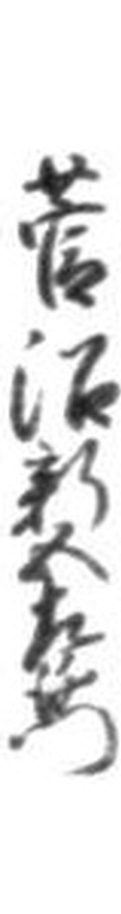菅沼新五左衛門

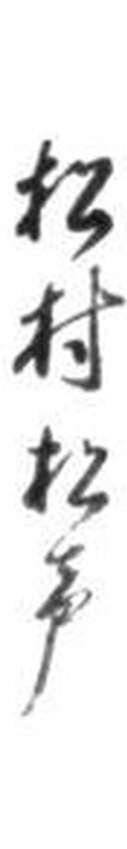松村松声
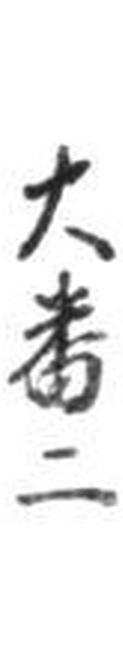大番二
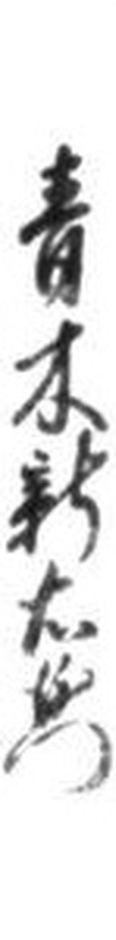青木新右衛門
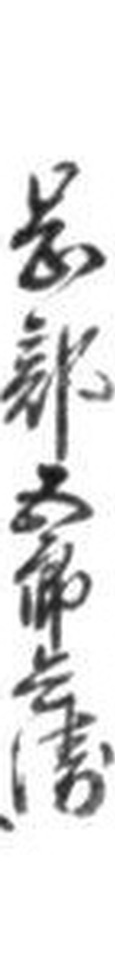岡部五郎兵衛
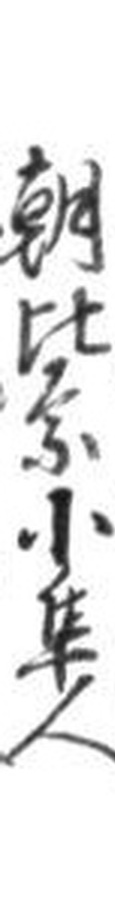朝比奈小隼人
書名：家譜 二 忠直公 従文禄四年到慶安四年
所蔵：福井県文書館 Fukui Prefectural Archives
